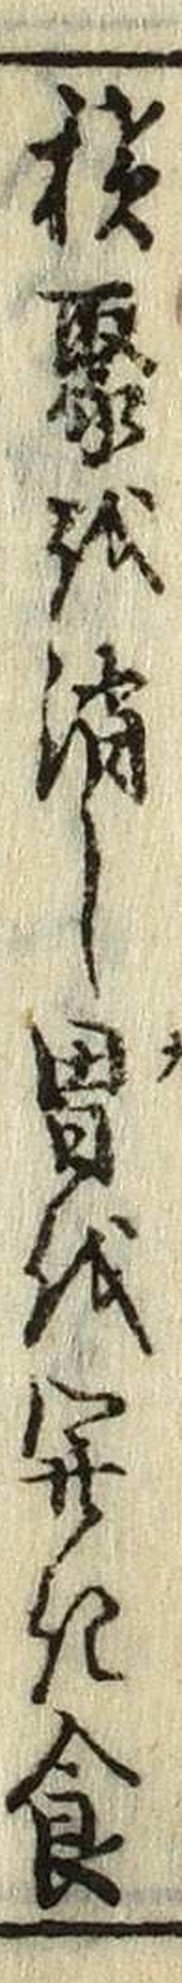積聚を消し胃を開き食
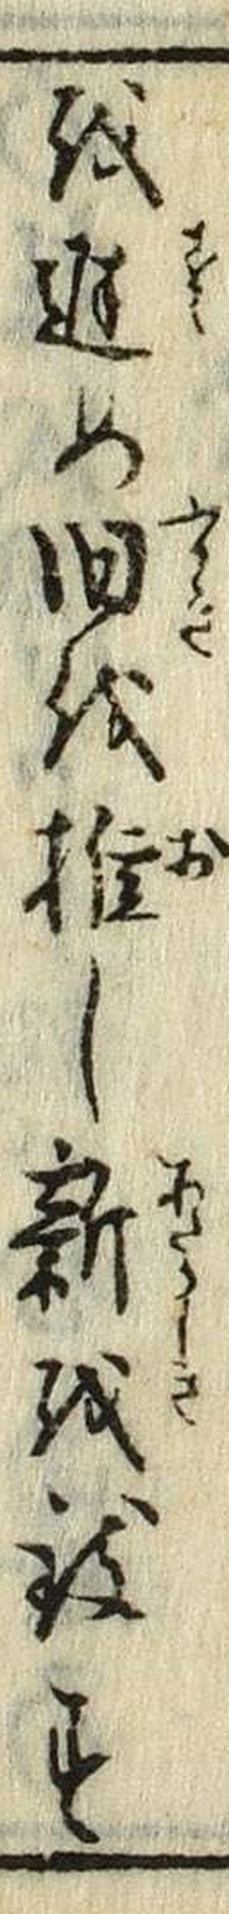を進め旧を推し新を致す
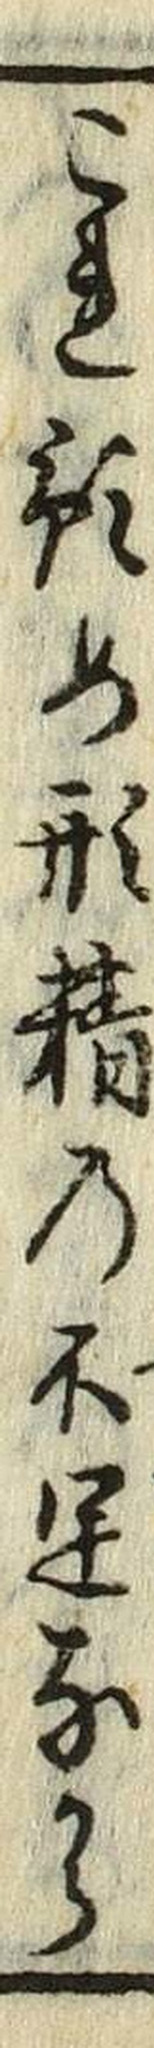これ予め形精の不足なから
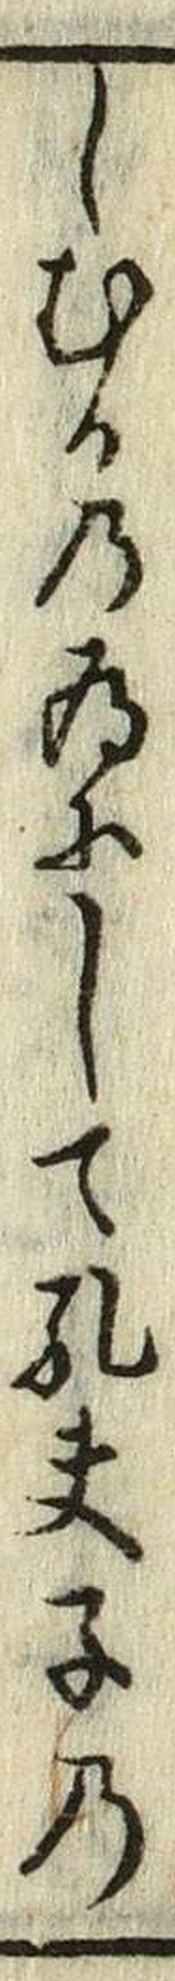しむるの為にして孔夫子の
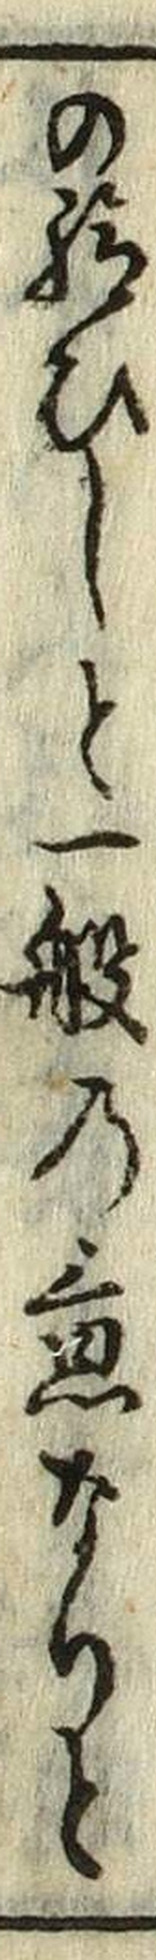の給ひしと一般の意なりと
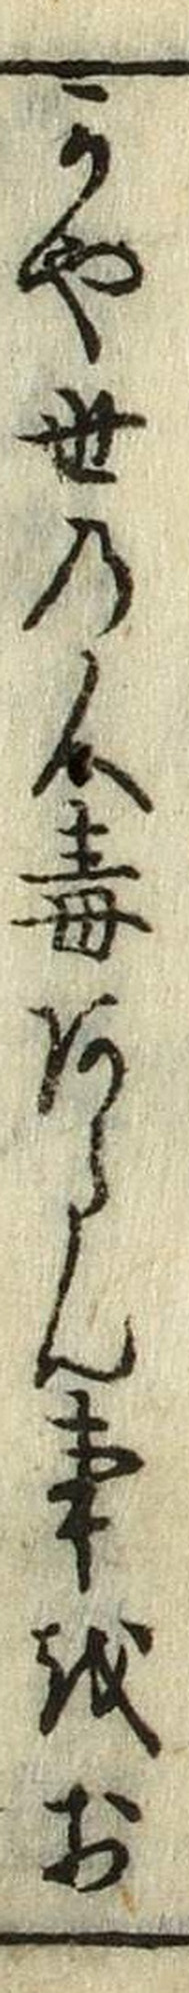かや世の人毒あらん事をお
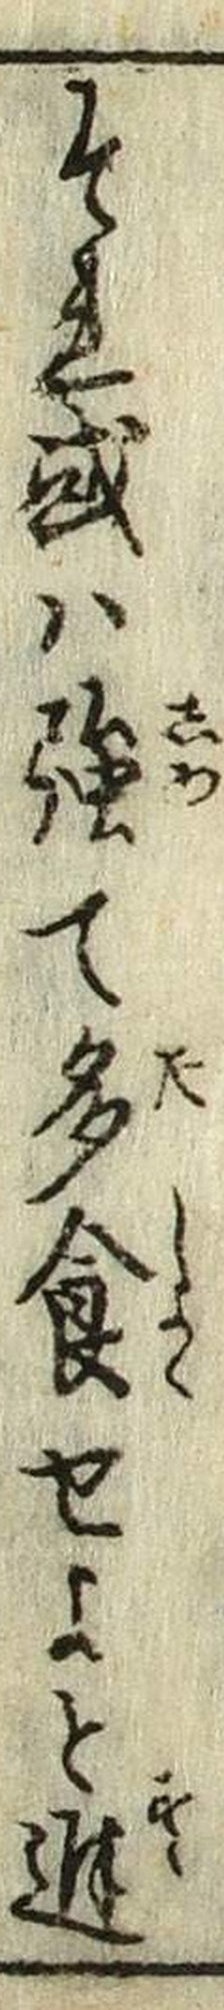それ或は強て多食せよと進
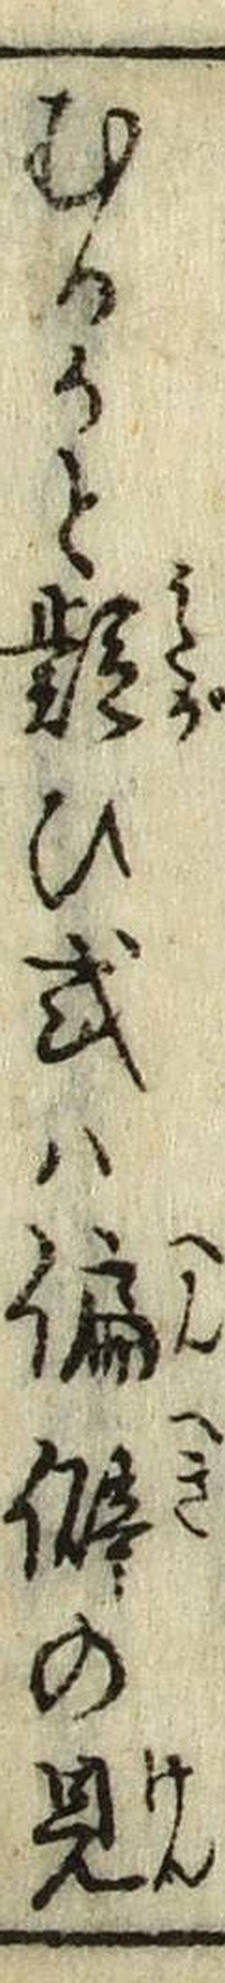むるかと疑ひ或は偏僻の見

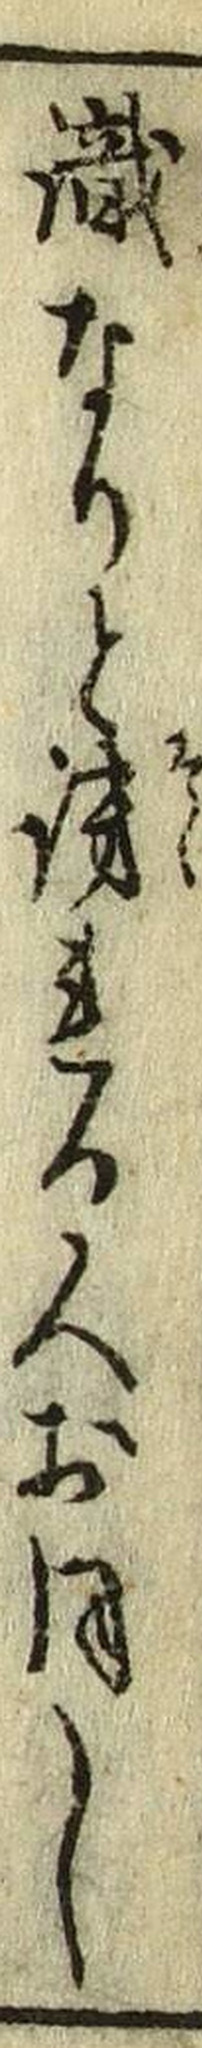識なりと譏れる人おほし
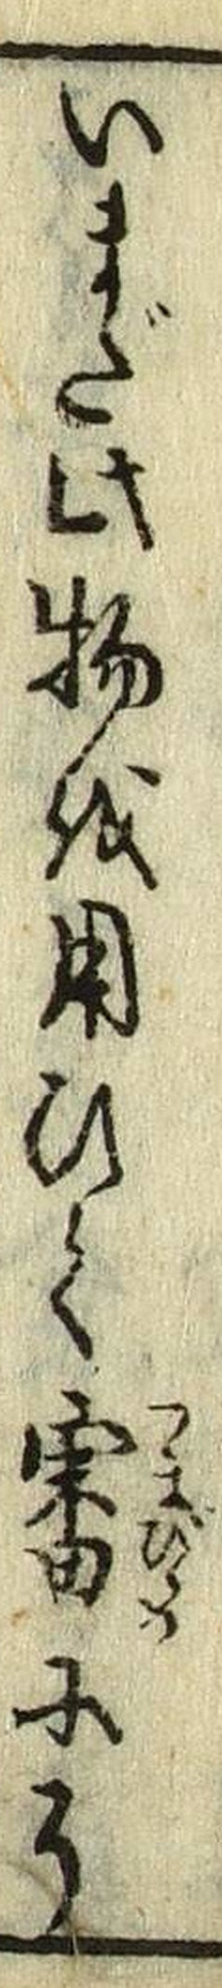いまだ此物を用ひて審にそ
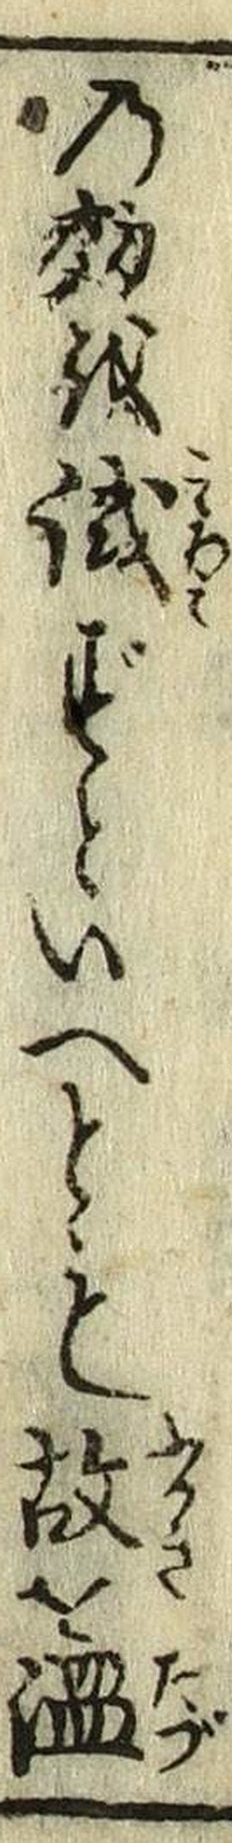の効を試ずといへとも故を温
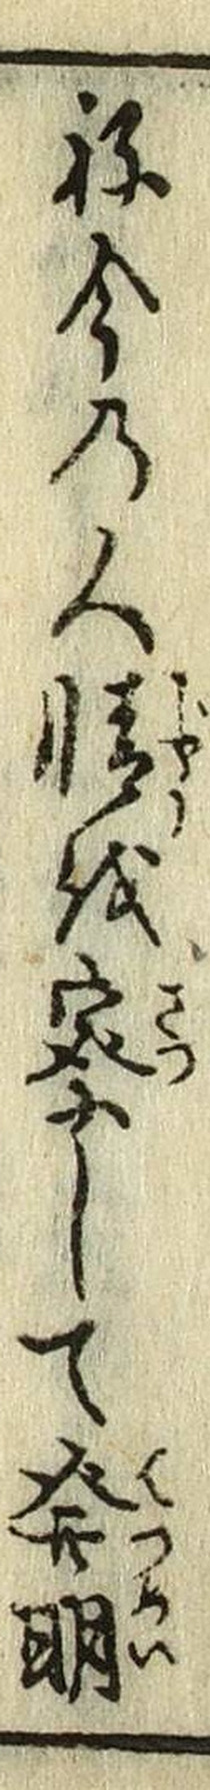ね今の人情を察して発明
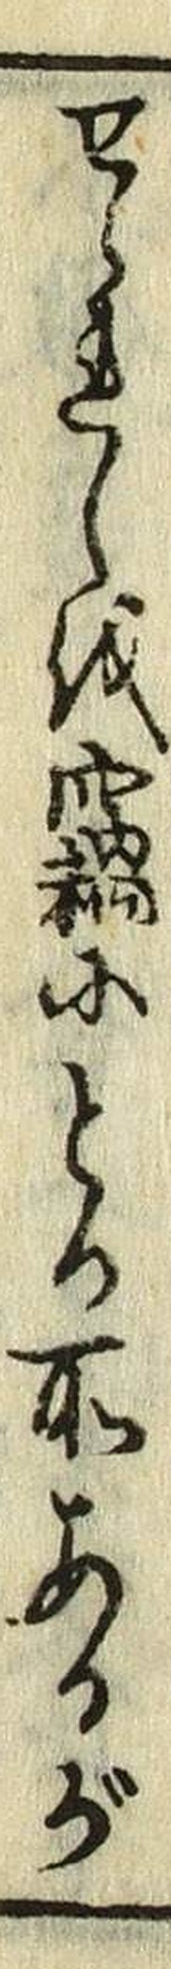せられしを窃にとる所あるが
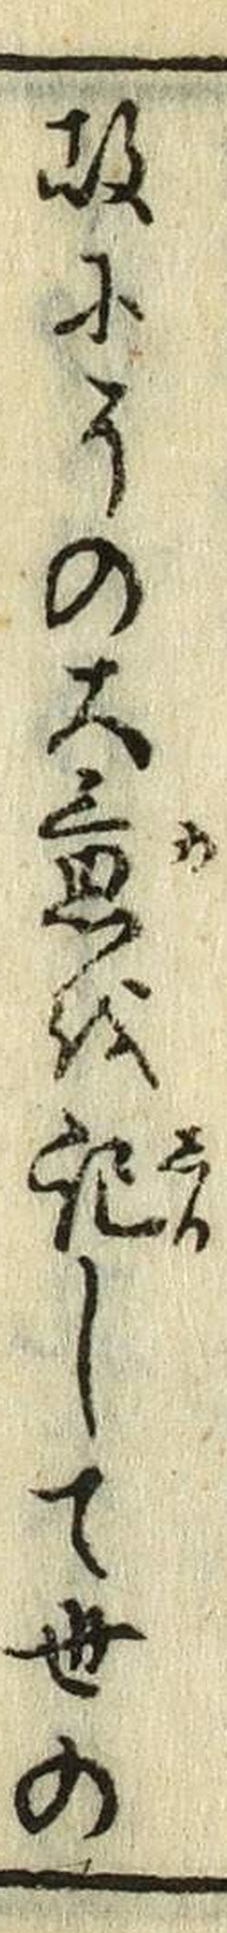故にその大意を記して世の
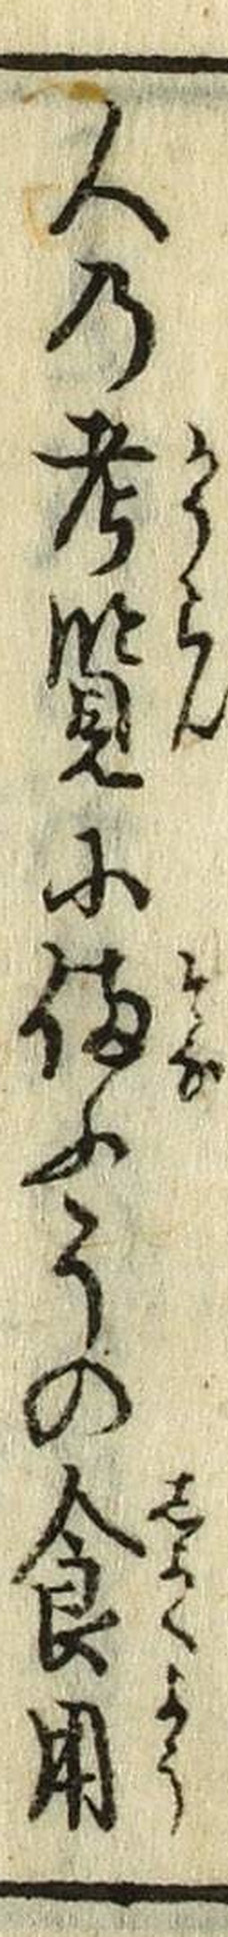人の考覧に備ふその食用
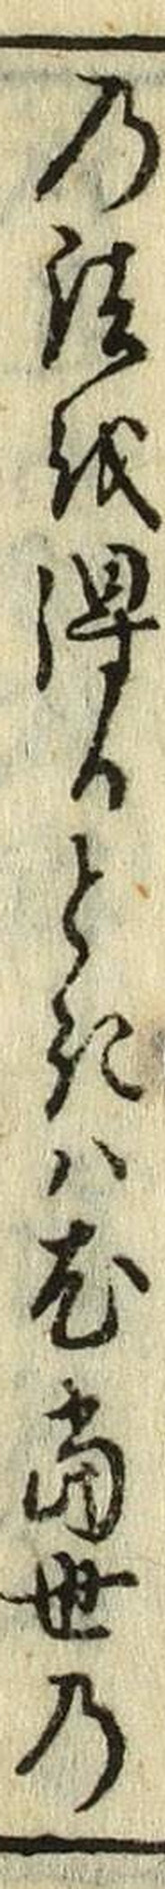の法を得るときは尤当世の
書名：居家養生記
